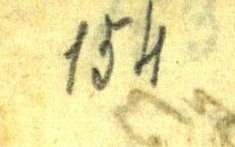154
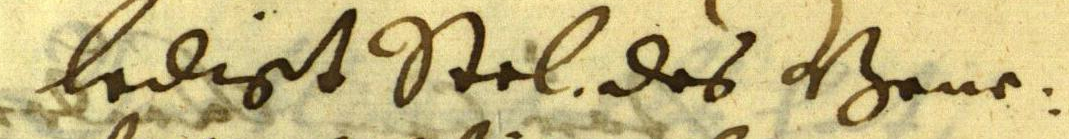ledigt Stel. des Bene¬
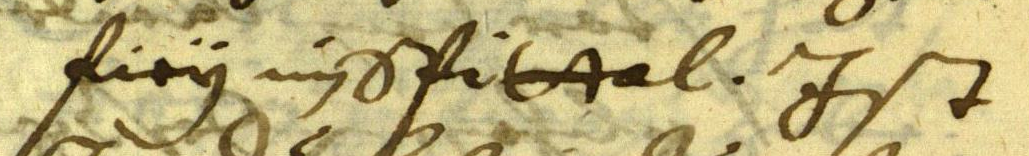ficÿ im Spittal. Ist
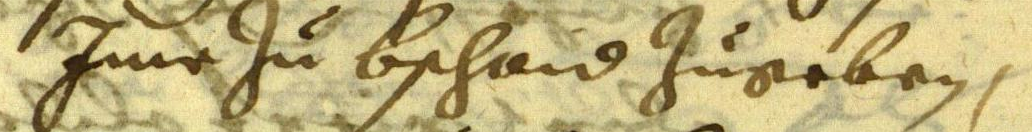Ime Zū bschaid Zūgeben,
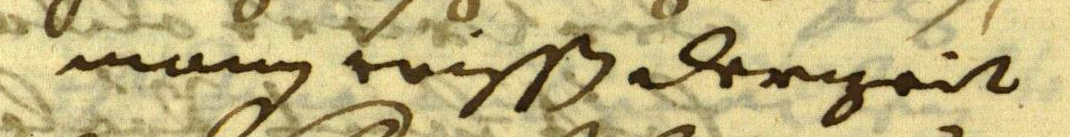mann wisß derzeit
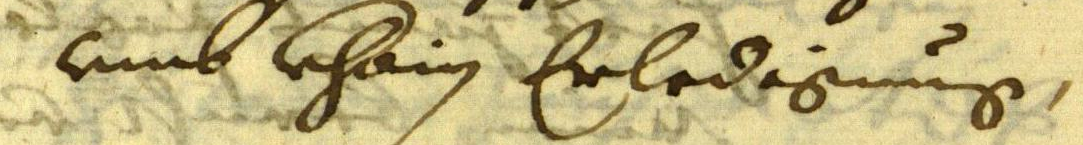vmb khain Erledigūng,
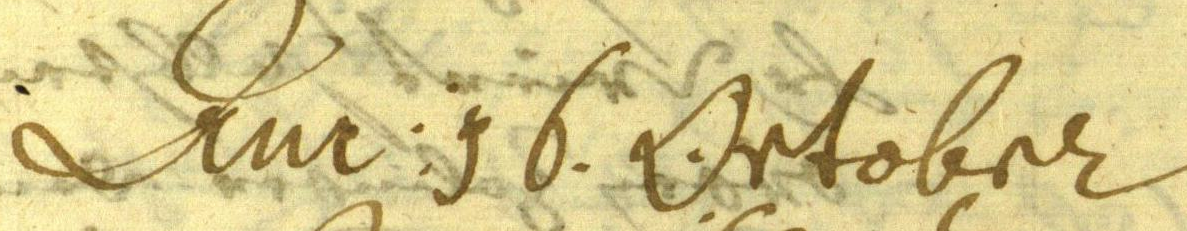Am: 16. October
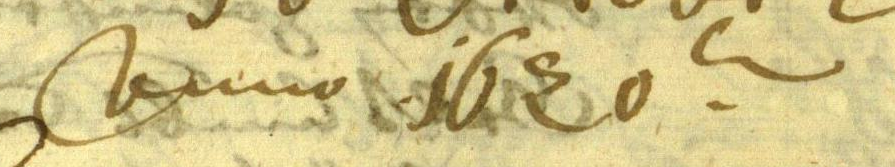Anno 1620.t
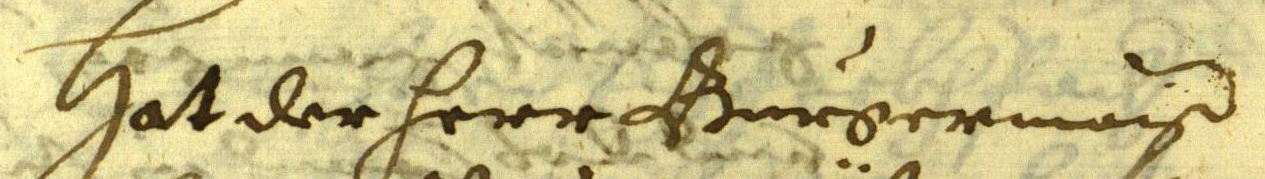Hat der herr Būrgermaist
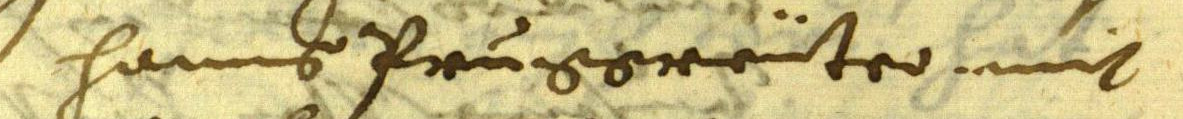Hanns Prūggreüter mit
